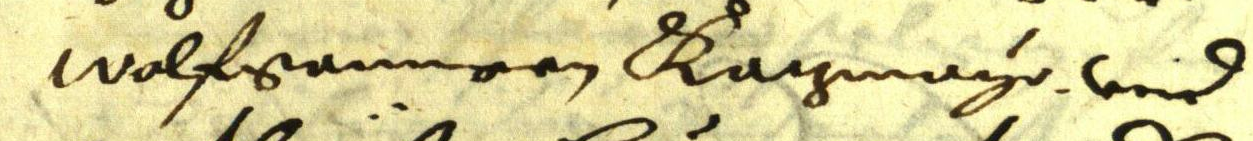Wolfganngen Kazmaȳr. vnd
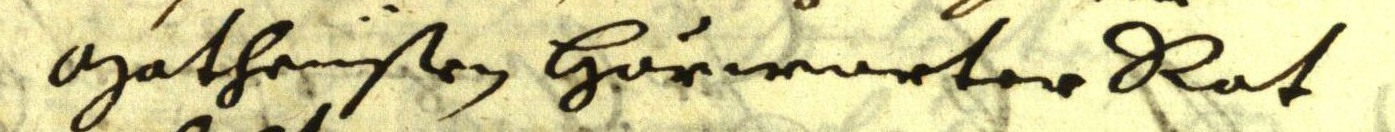Matheisen Hōrwarter Rat
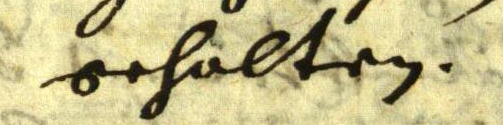gehalten.
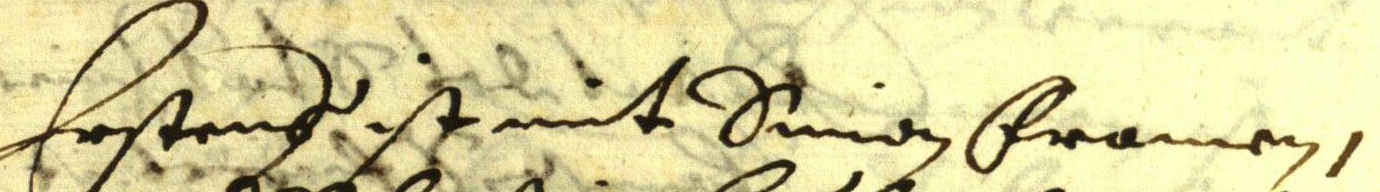Erstens ist mit Simon Fromen,
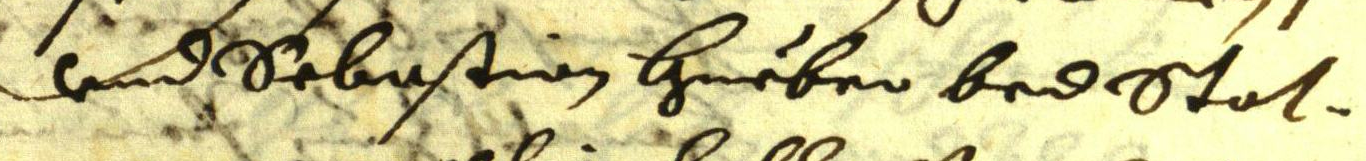vnd Sebastian Hūeber bed Stat¬
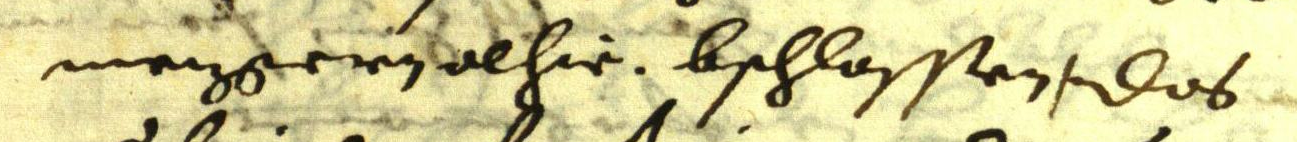mezger alhie. bschlossen, das
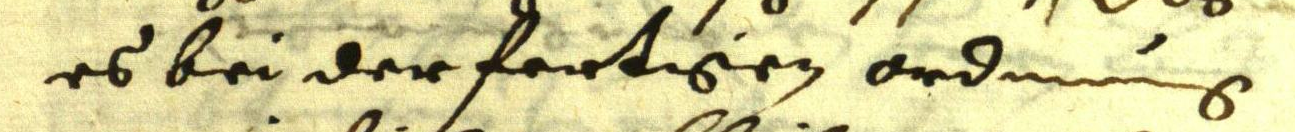es bei der fertigen ordnūng
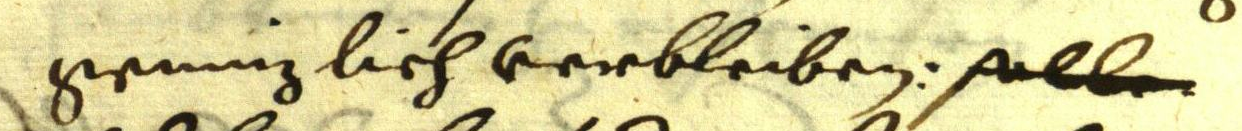gennzlich verbleiben: sollen
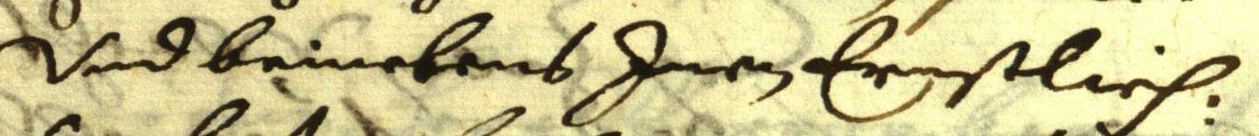Vnd beinebens Inen Ernstlich:
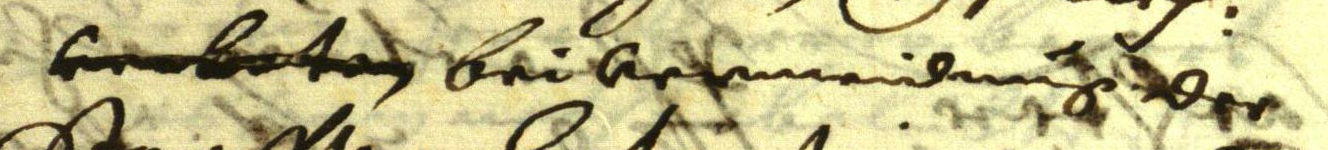verboten bei vermeidūng der
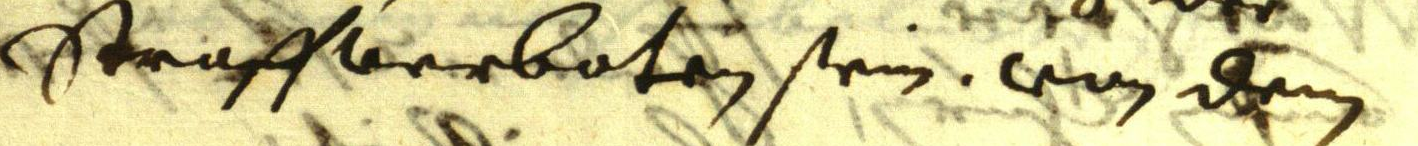Straff verboten sein. von dem
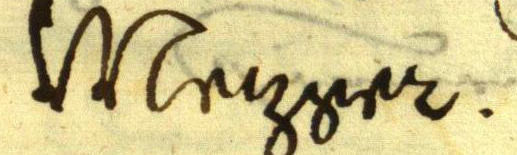Mezger.
